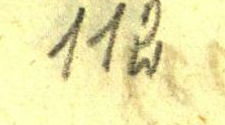112
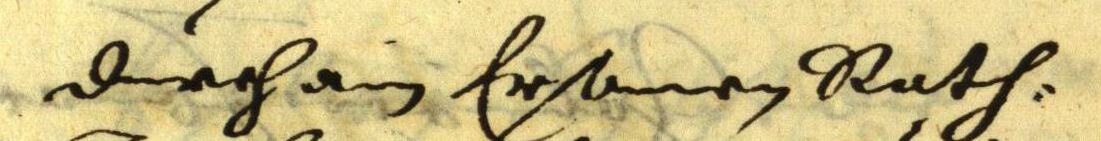dūrch ain Ersamen Rath
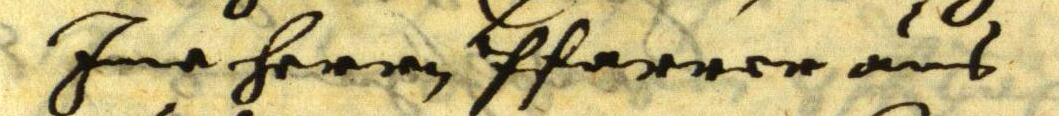Ime herrn Pfarrer aūs
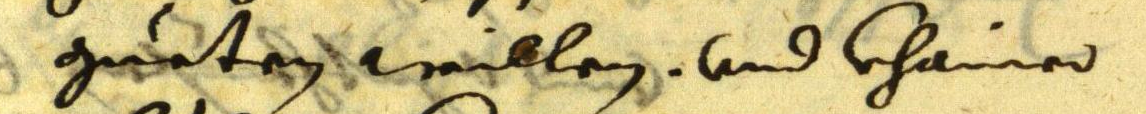gūeten willen. vnd khainer
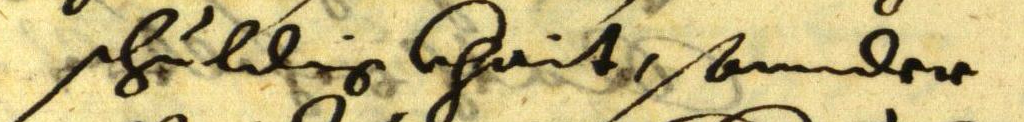schūldigkhait, sonnder
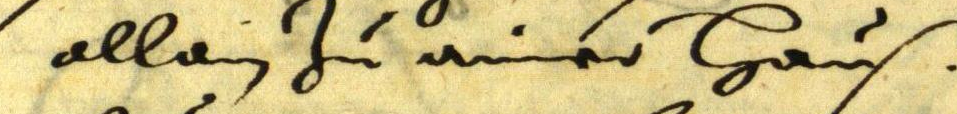allain Zū ainer Haūs¬
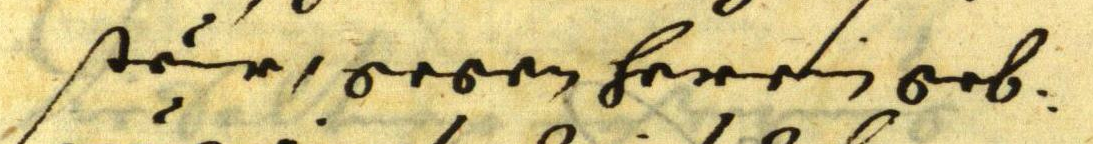steūr, gegen herein geb¬
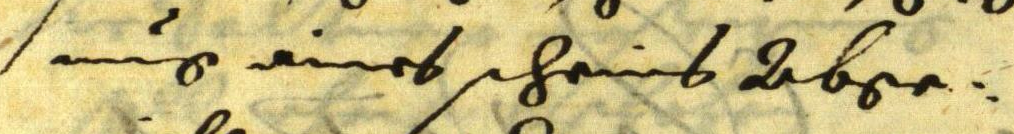ūng aines scheins Abge¬
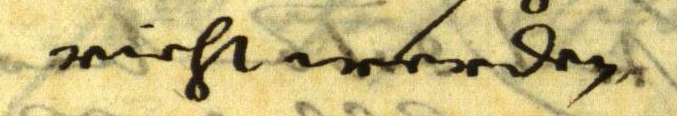richt werden.
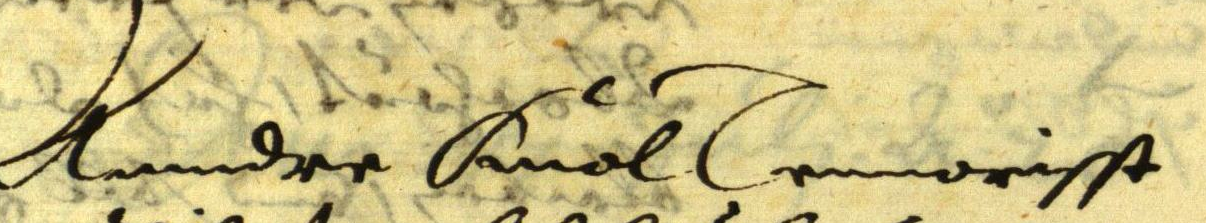Anndre Knol Tennorisst
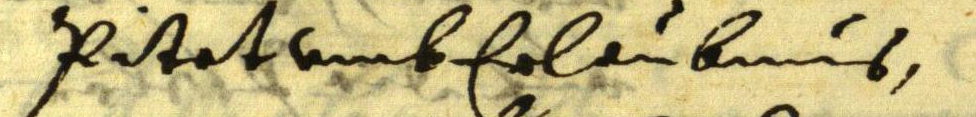Pitet vmb Erlaūbūng,
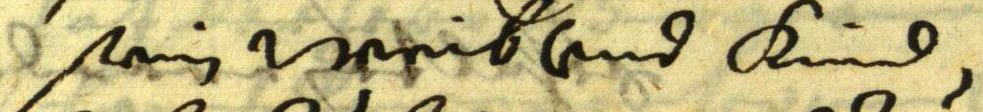sein Weib vnd Kind
